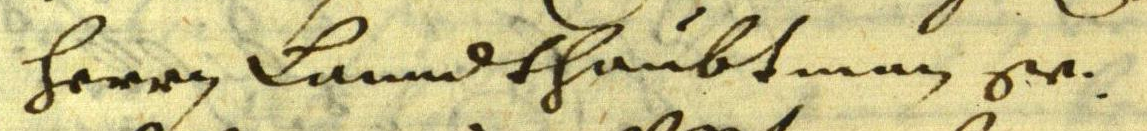herrn Lanndthaūbtman ge¬
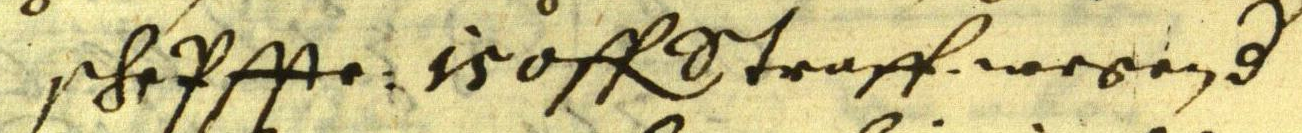schePffte: 150 fl Straff. wegen d
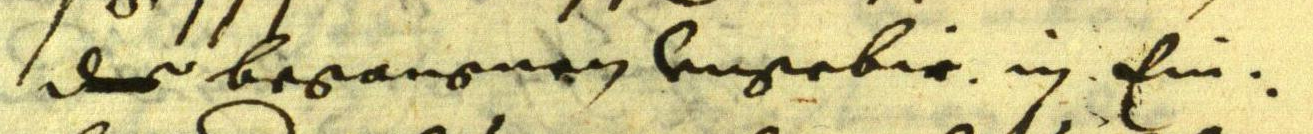des begangnen Ungebir. in Ein¬
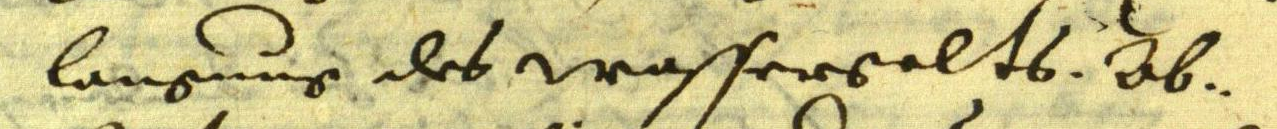langūng des Wassergelts. Ab¬
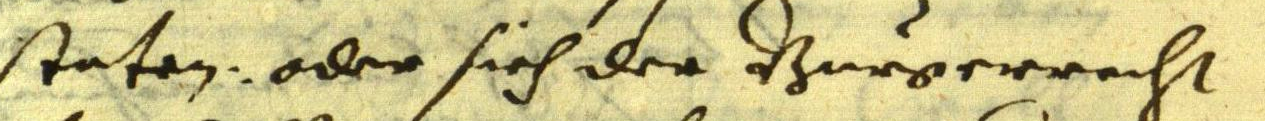staten: oder sich der Būrgerrecht
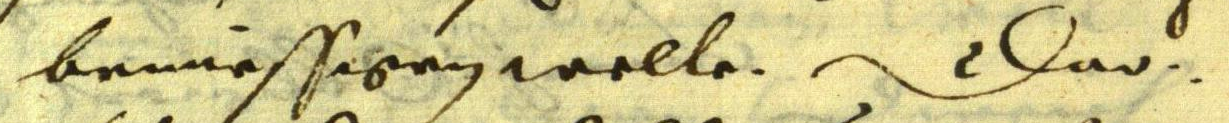bemiessigen welle. Dar¬
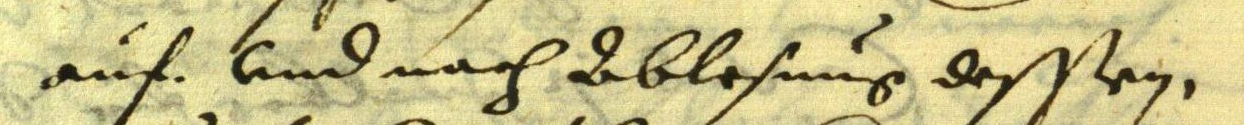aūf. vnd nach Ablesūng dessen,
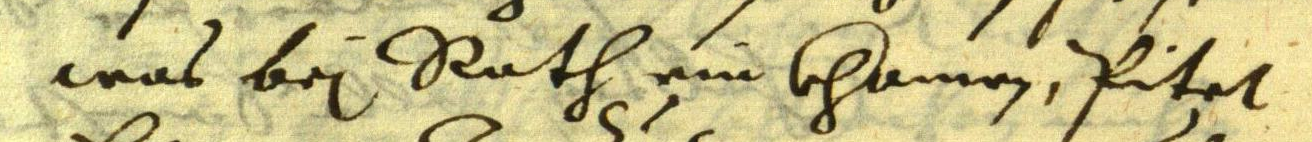was bei Rath ein khomen, Pitet
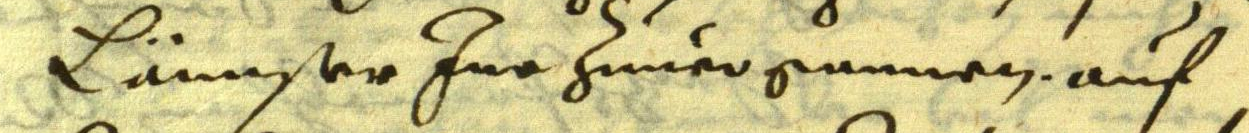Lännser Ine Zūūergonnen. aūf
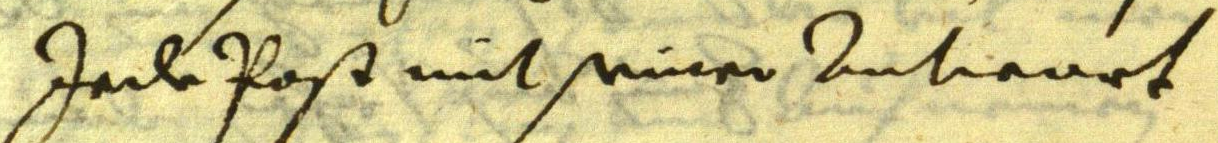Jede Post mit seiner Antwort
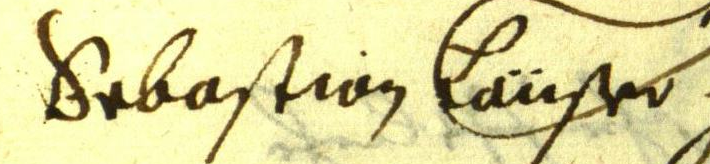Sebastian Länser
